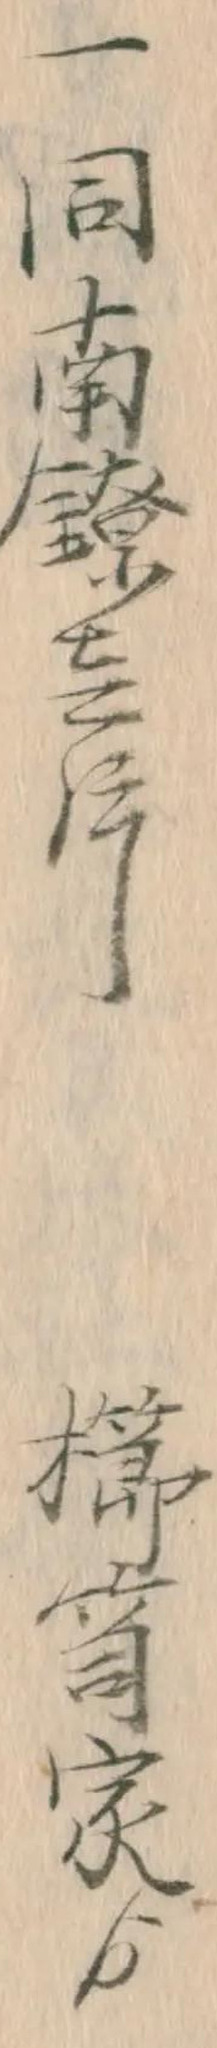一同南鐐壱片櫛笥家ゟ
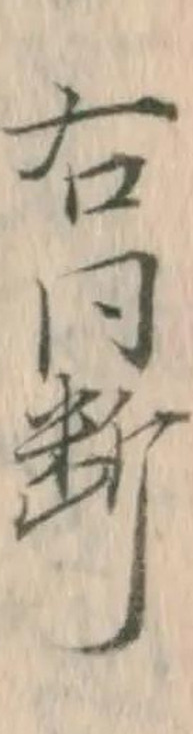右同断
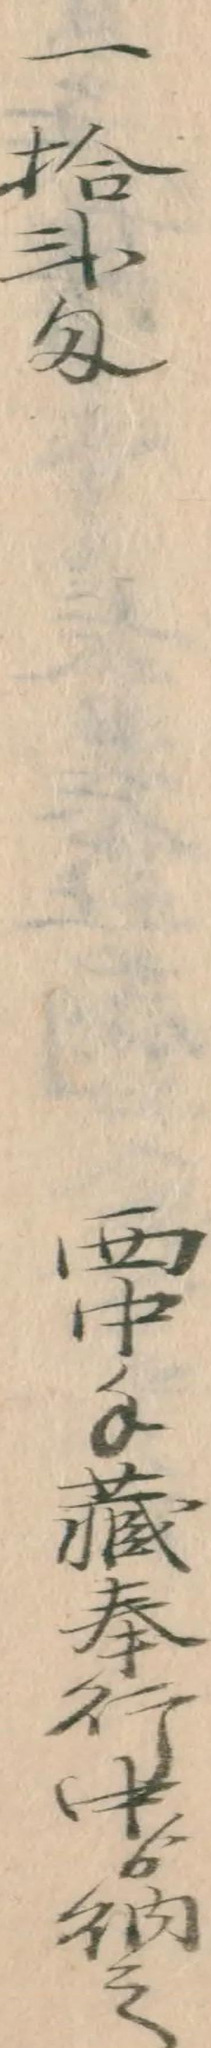一拾弐匁西中手蔵奉行中ゟ納之
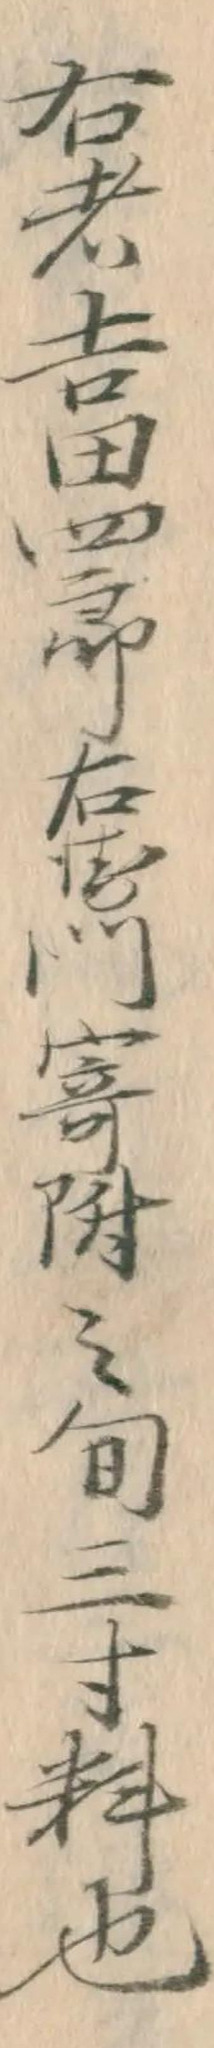右は吉田四郎右衛門寄附之旬三寸料也

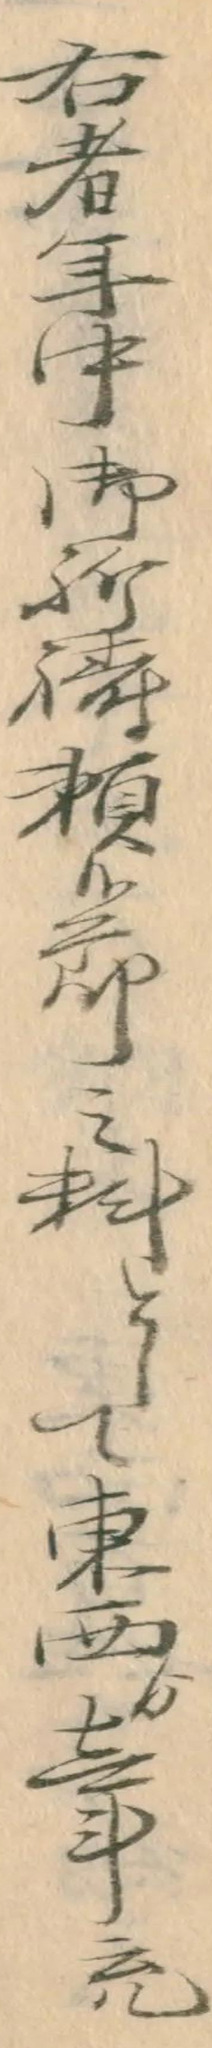右者年中御祈祷頼候節之料として東西ゟ壱斗宛
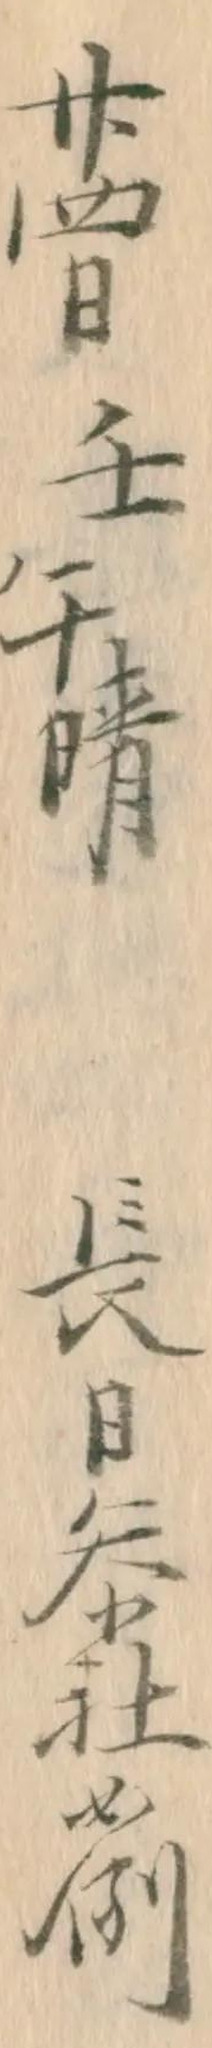廿四日壬子晴長日参社如例
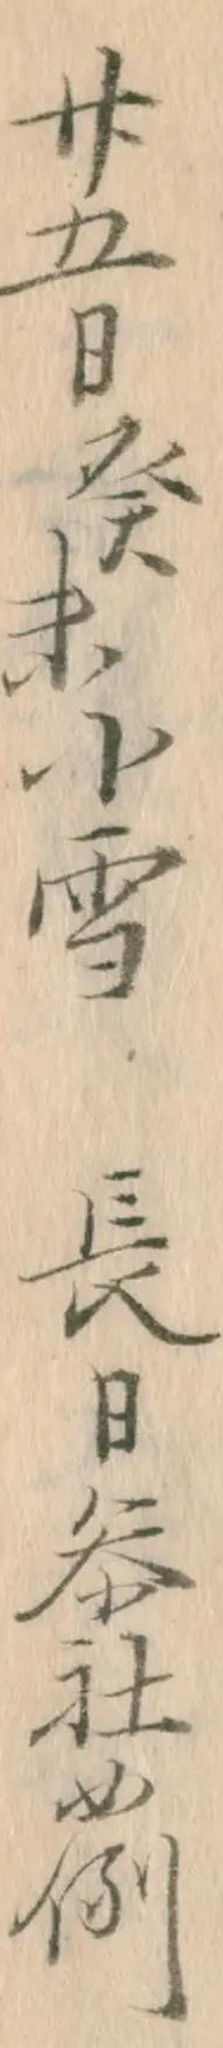廿五日癸未小雪長日参社如例
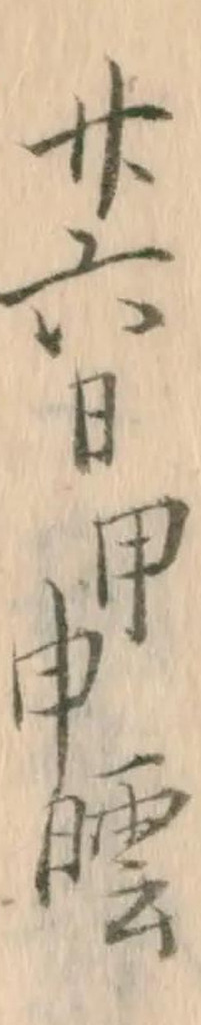廿六日甲申曇
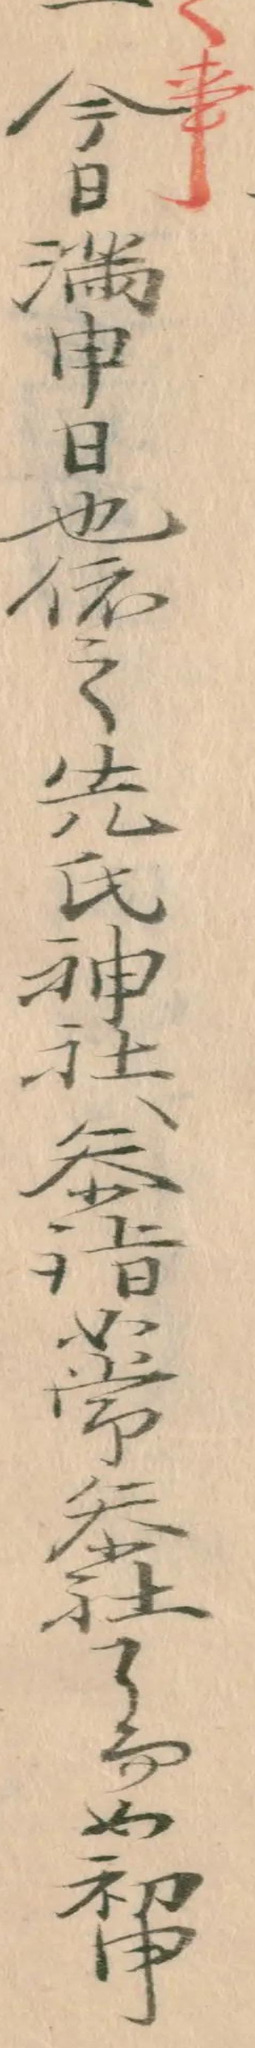一今日満申日也依之先氏神社へ参詣如常参社了而如初申
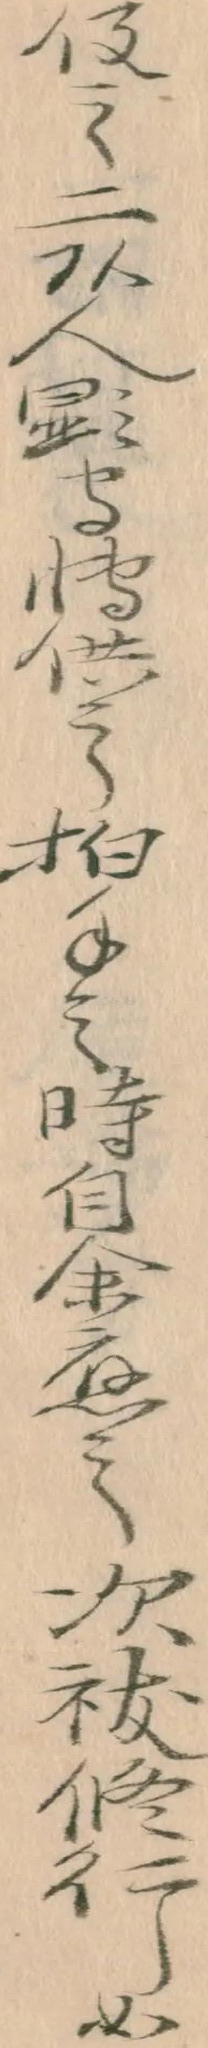役之二頭人顕守轉供之拍手之時自余應之次祓修行如
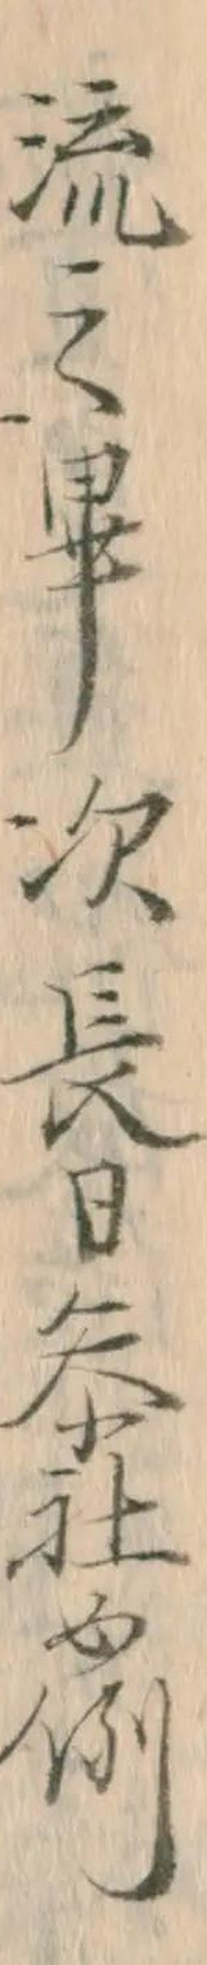流之畢次長日参社如例
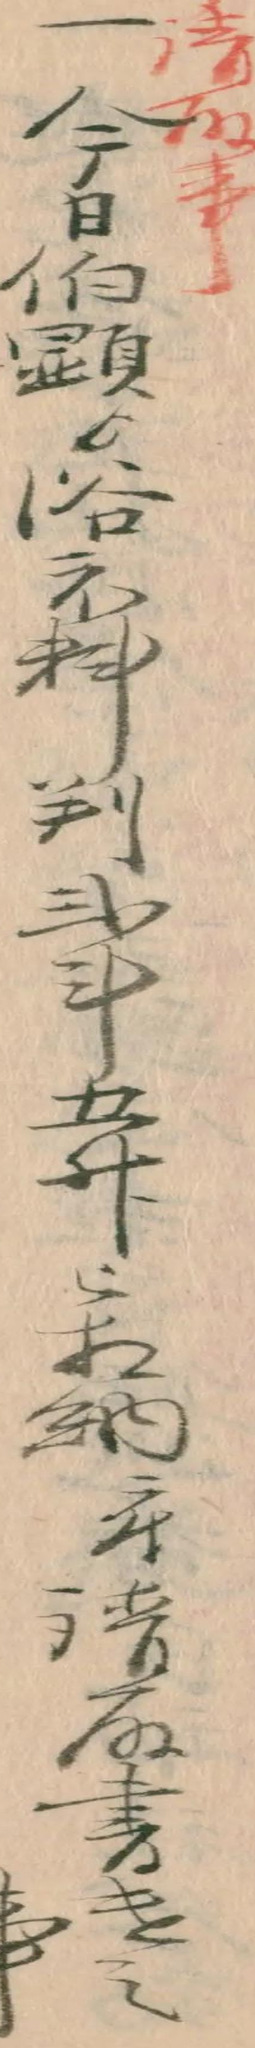一今日伯顕ゟ浴衣料判弐斗五升被相納ニ付請取書遣之事
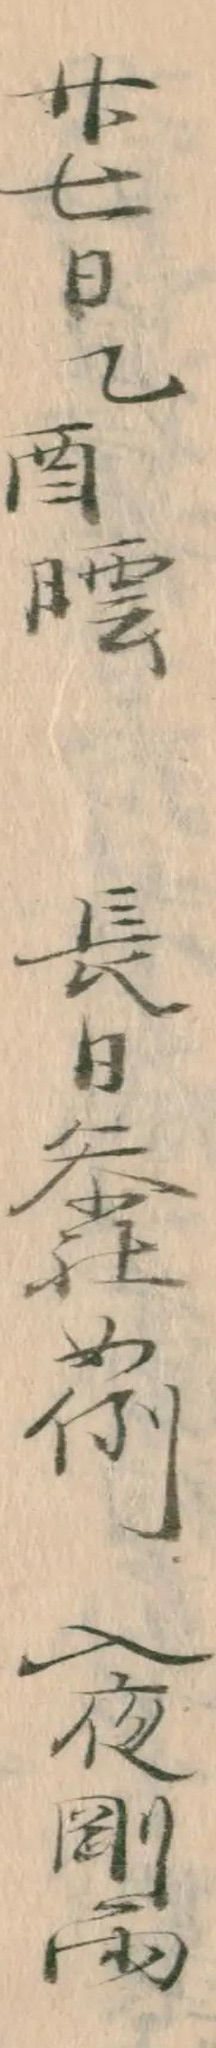廿七日乙酉曇長日参社如例入夜剛雨
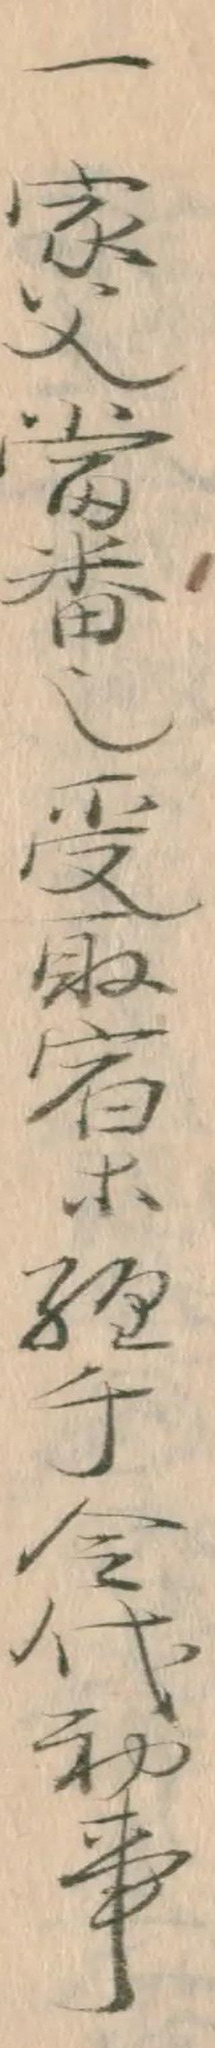一家父當番也受取宿等経于令代勤事
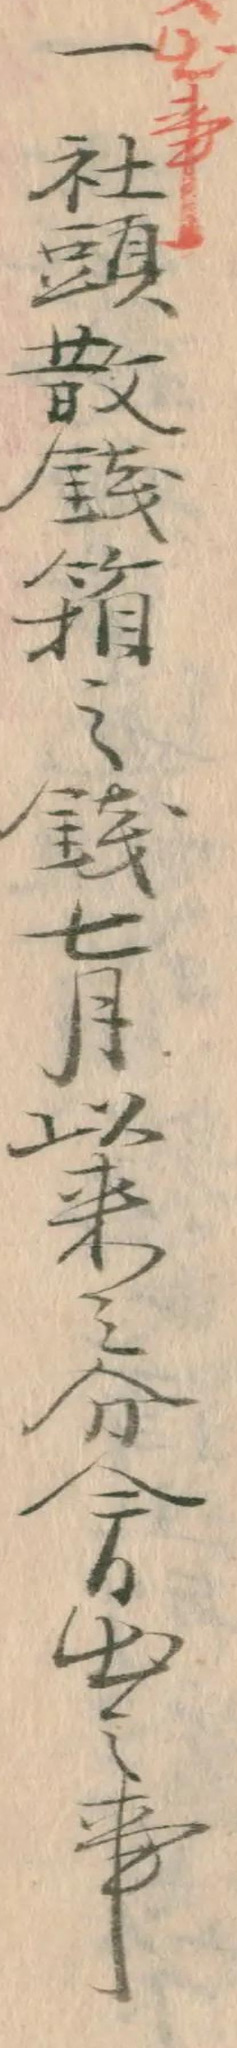一社頭散銭箱之銭七月以来之分今日出之事
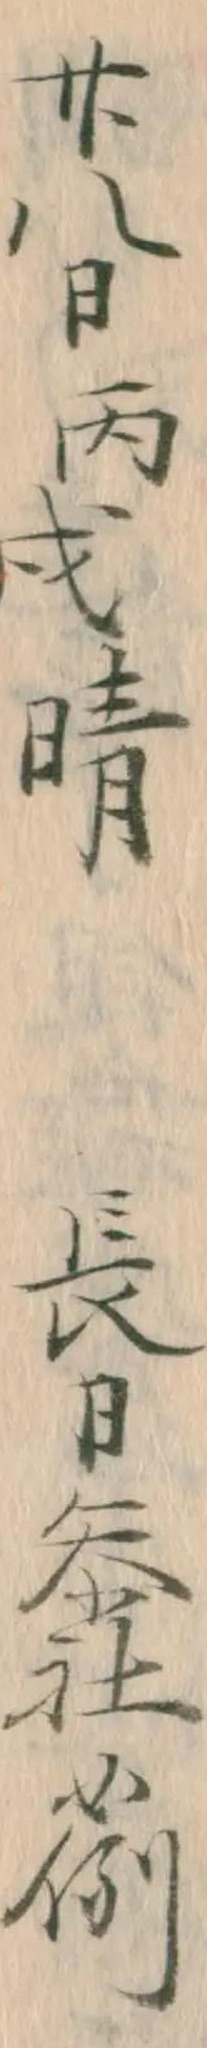廿八日丙戌晴長日参社如例
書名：賀茂社記録. 第74冊
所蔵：国立国会図書館 National Diet Library, JAPAN
